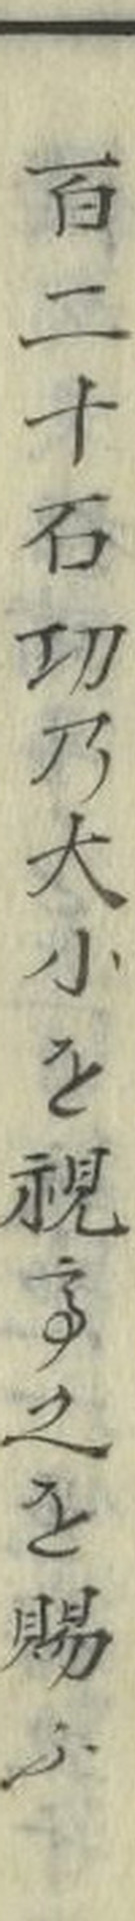百二十石功の大小を視て之を賜ふ
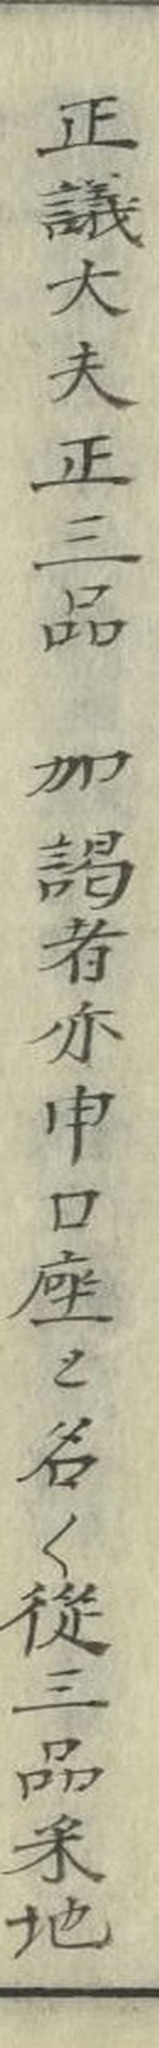正議大夫正三品加謁者亦申口座と名く従三品采地
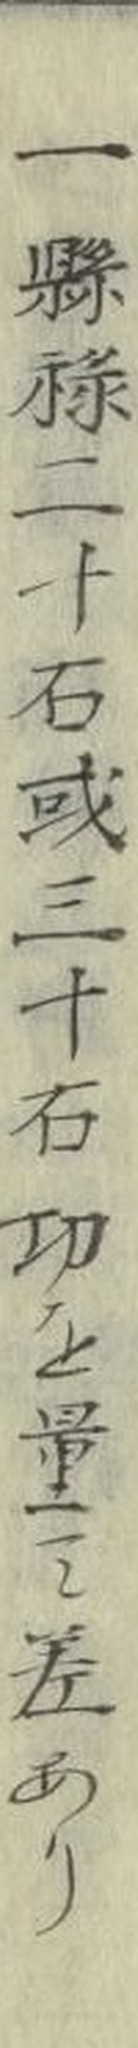一県禄二十石或三十石功を量て差あり
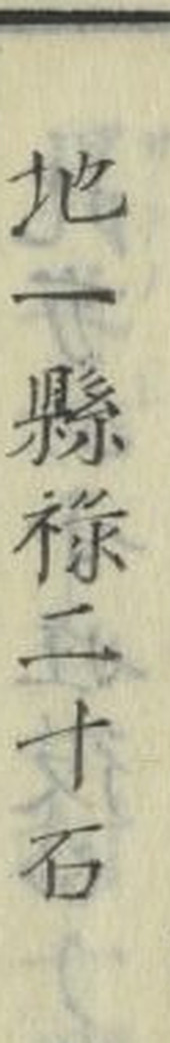地一県禄二十石
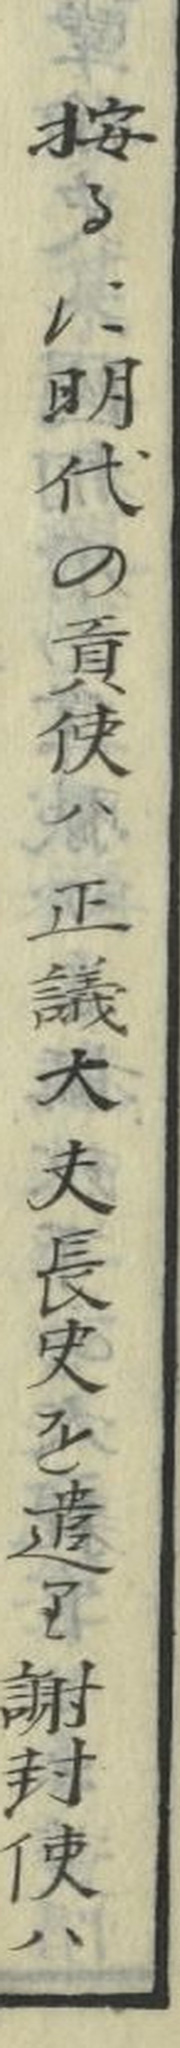按るに明代の貢使は正議大夫長史を遣り謝封使は
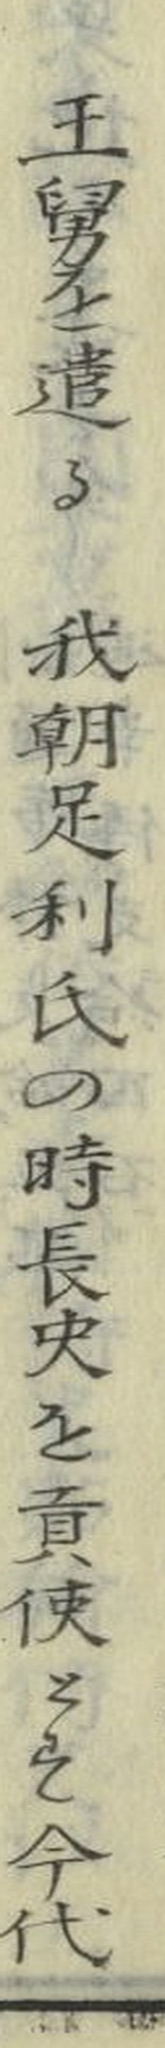王舅を遣る我朝足利氏の時長史を貢使とす今代
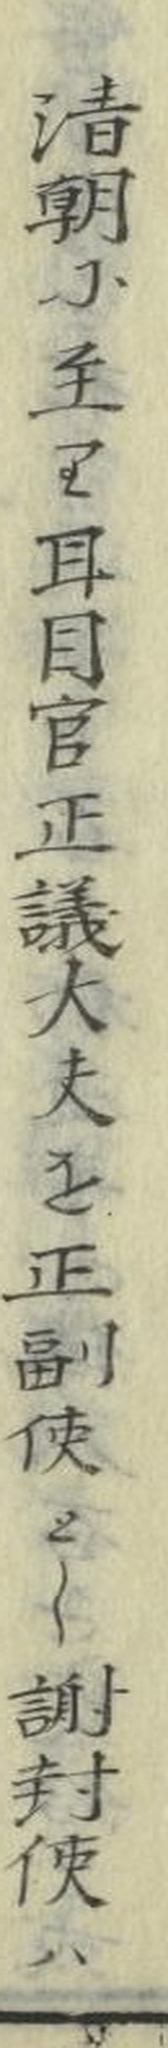清朝に至り耳目官正議大夫を正副使とし謝封使は
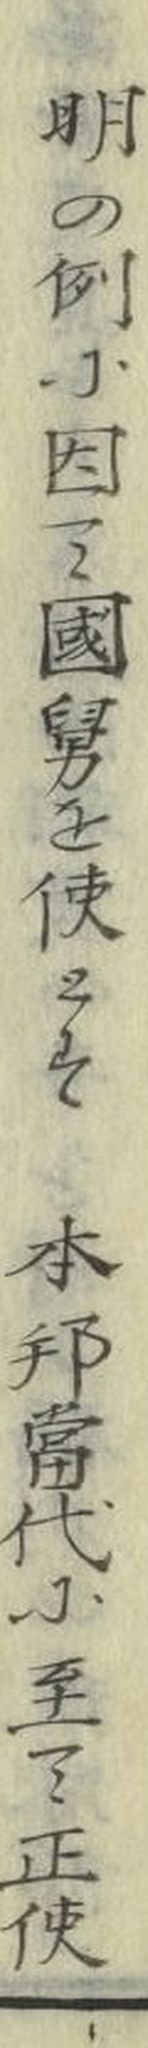明の例に因て国舅を使とす本邦当代に至て正使
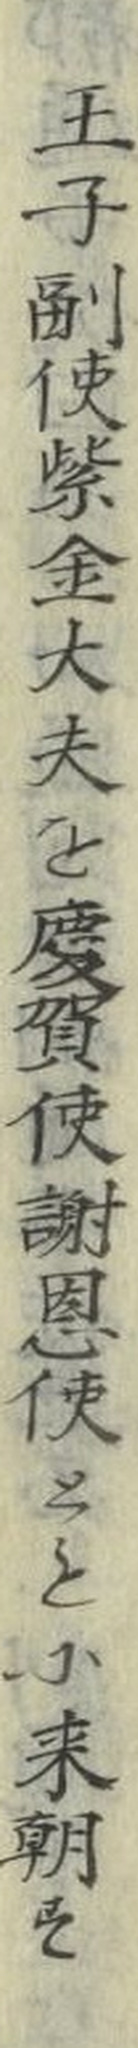王子副使紫金大夫を慶賀使謝恩使ともに来朝す
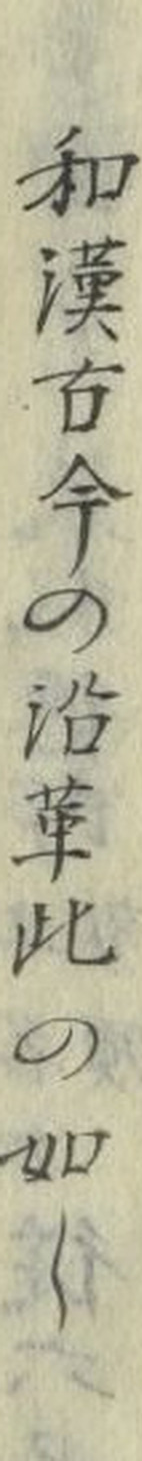和漢古今の沿革此の如し
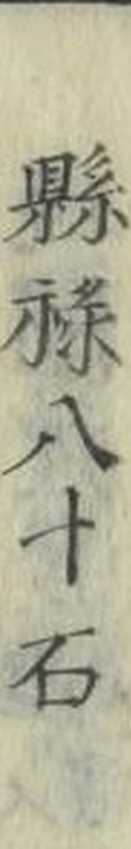県禄八十石

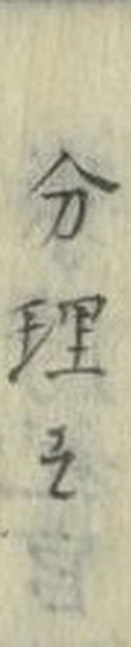分理す
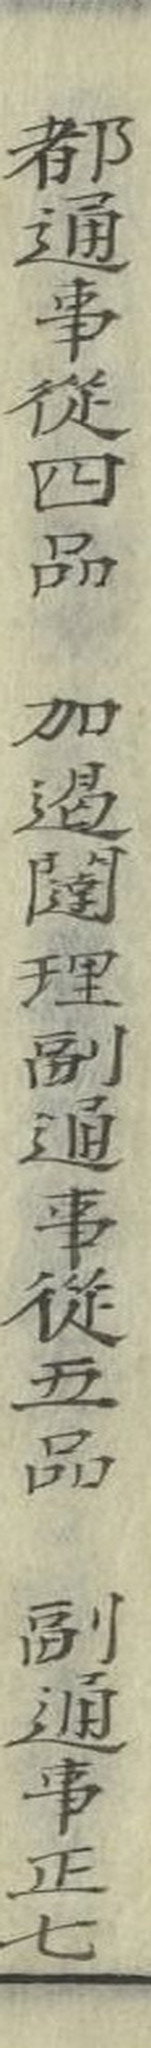都通事従四品加遏闥理副通事従五品副通事正七
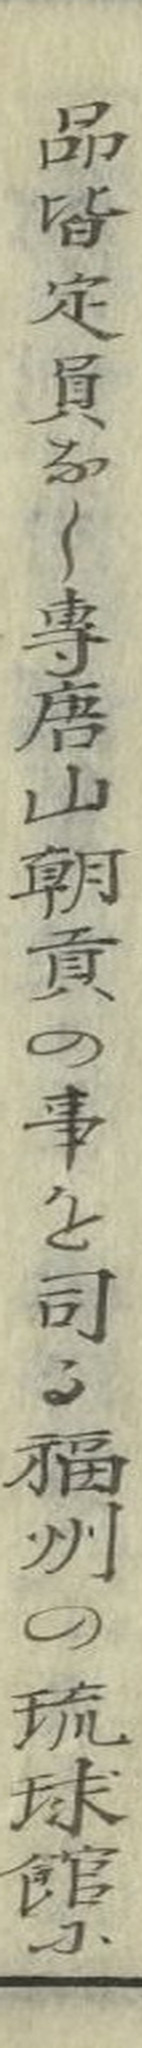品皆定員なし専唐山朝貢の事を司る福州の琉球館に
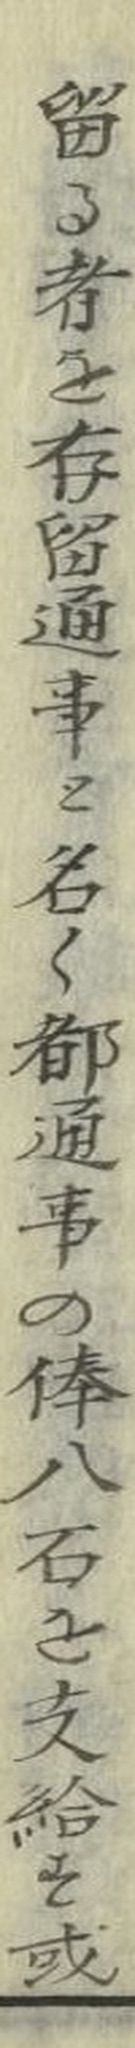留る者を存留通事と名く都通事の俸八石を支給す或
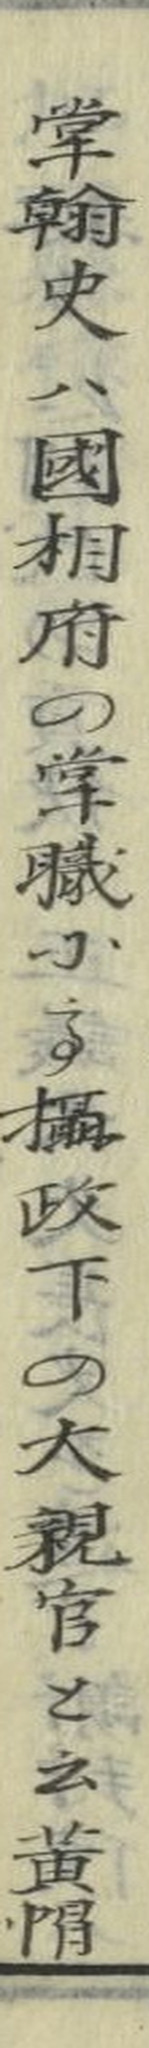掌翰史は国相府の掌職にて摂政下の大親官と云黄帽
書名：琉球沿革志 上
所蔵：University of the Ryukyus Library
